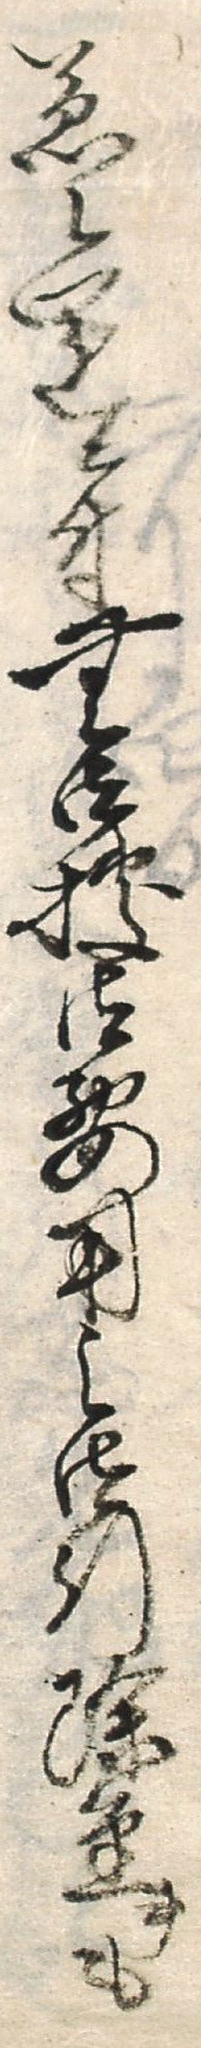兼候運に付無御拠御要用之御引除金をも
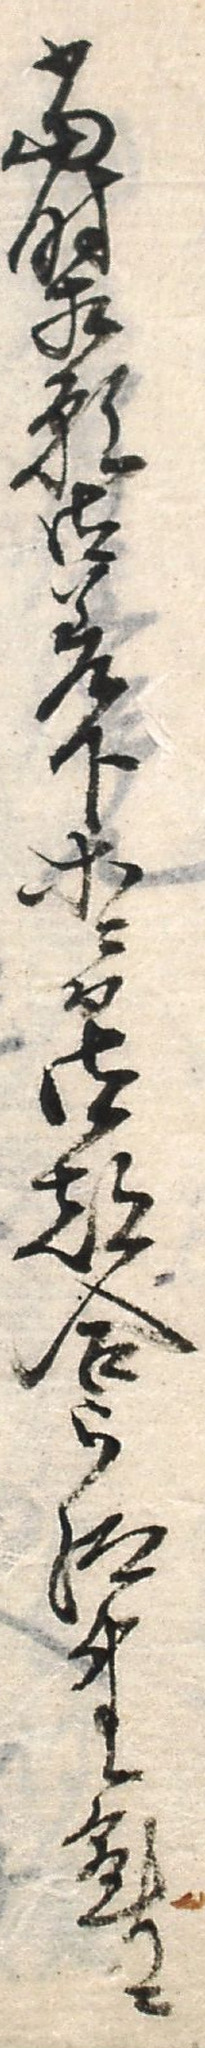当時相願御差下等に而御都合被仰付候懸りに
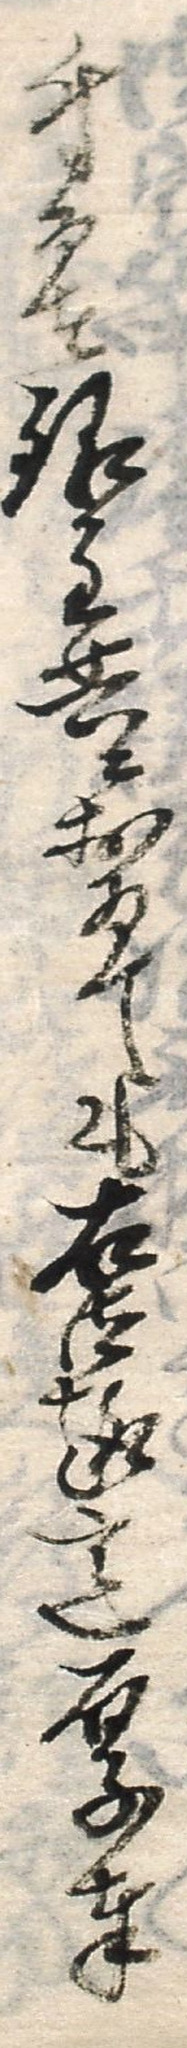付而は銀主共におゐても右御趣意厚奉
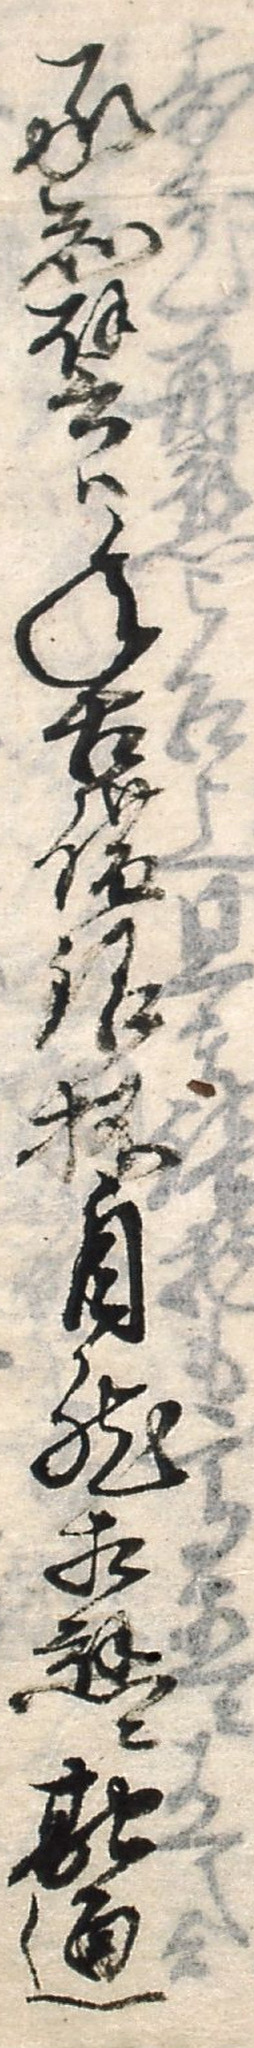承知譬は年古借銀抔自然相応に融通
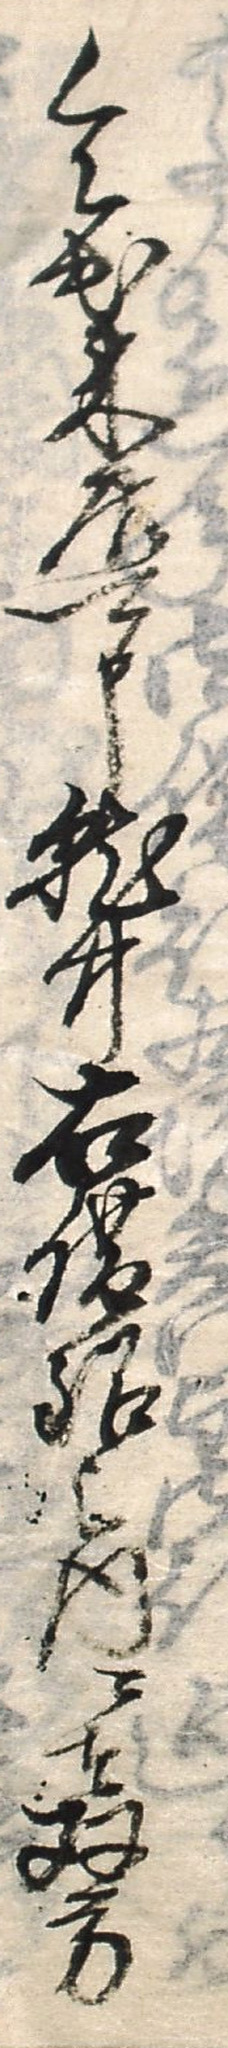令出来居可申然中右借銀の之内には双方
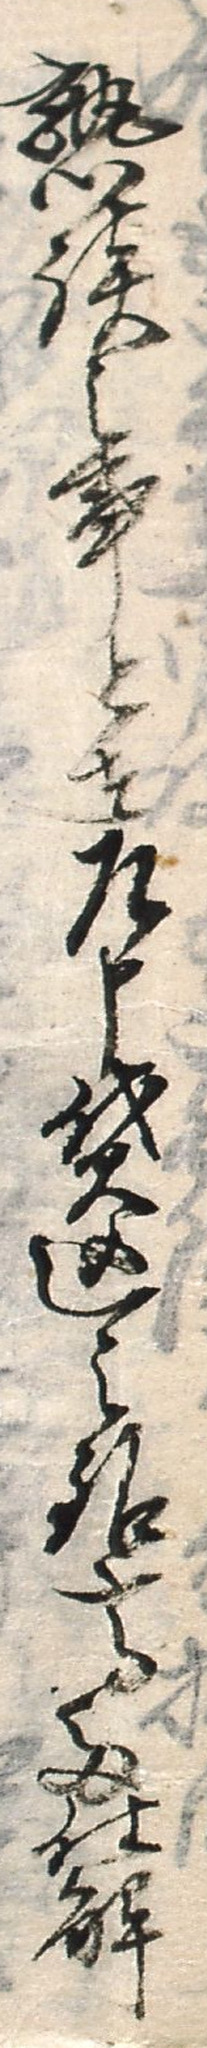熟談之事とは乍申貸込之銀高多仕解
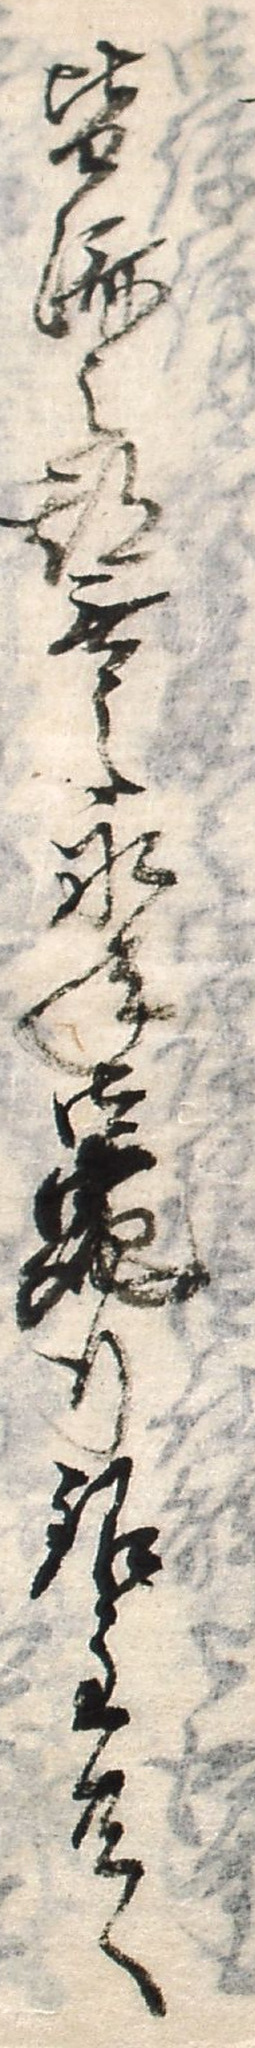皆済之期無之永年御宛行銀主共へ
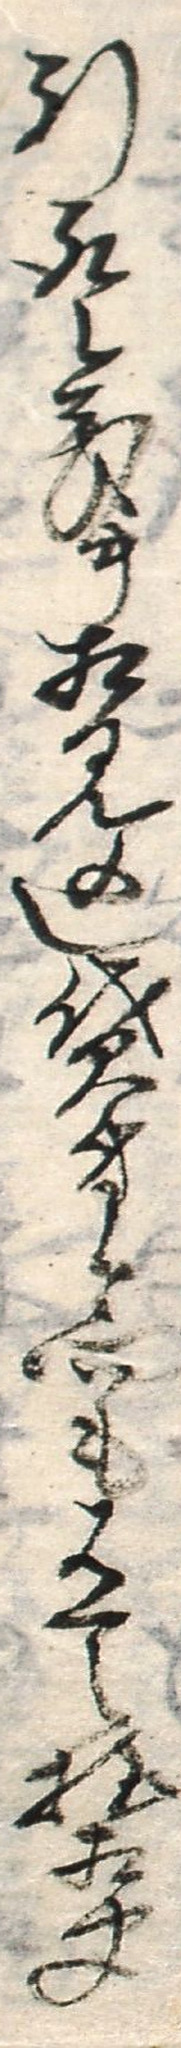引取候義を相見込貸付候向も有之様相聞
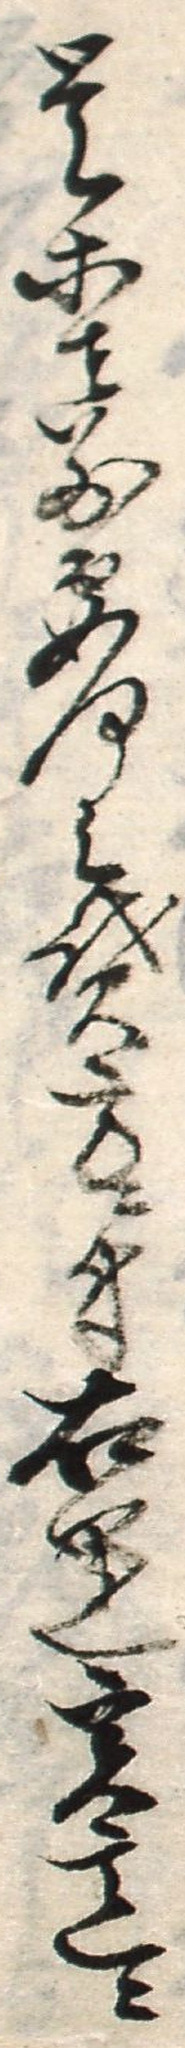是等は別而如何之貸方に付右運実意に
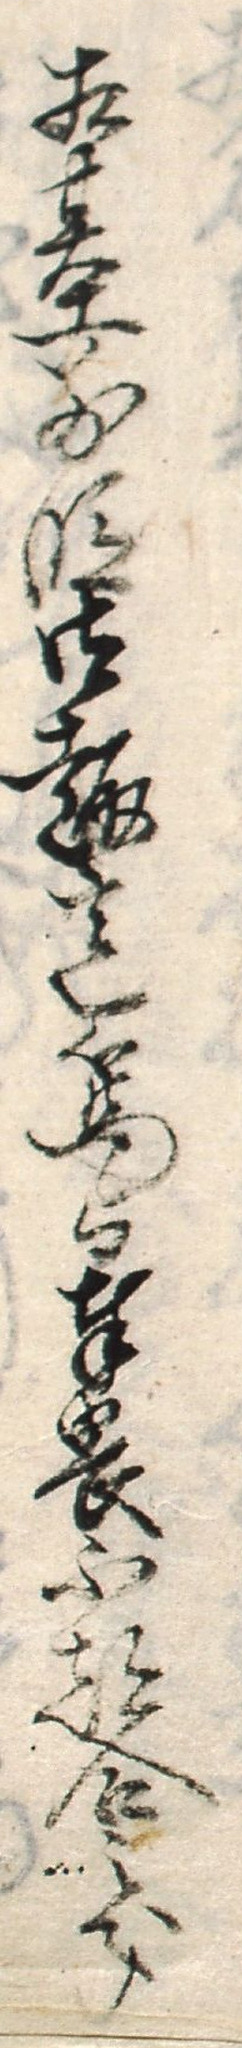相基別段御趣意篤と奉畏不都合之義
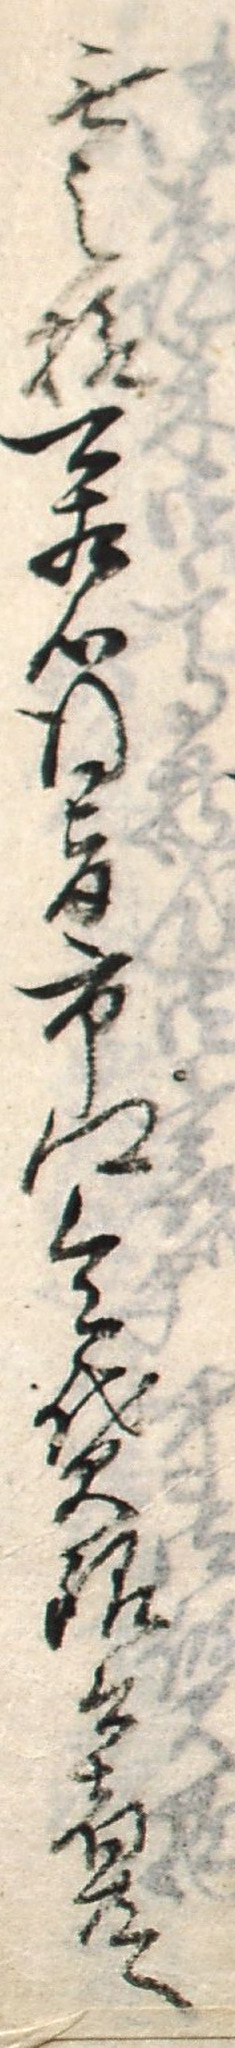無之様可相心得旨市郷令貸銀候者共へ
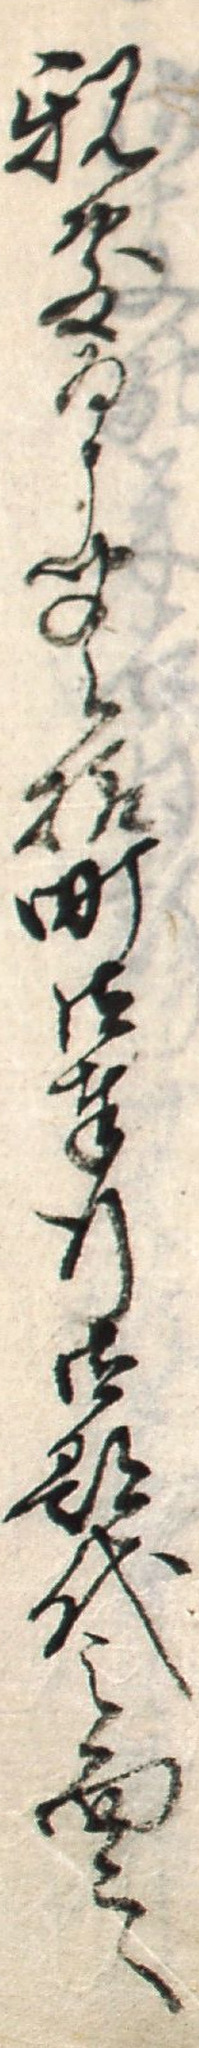親敷為申聞候様町御奉行御郡代之面々へ

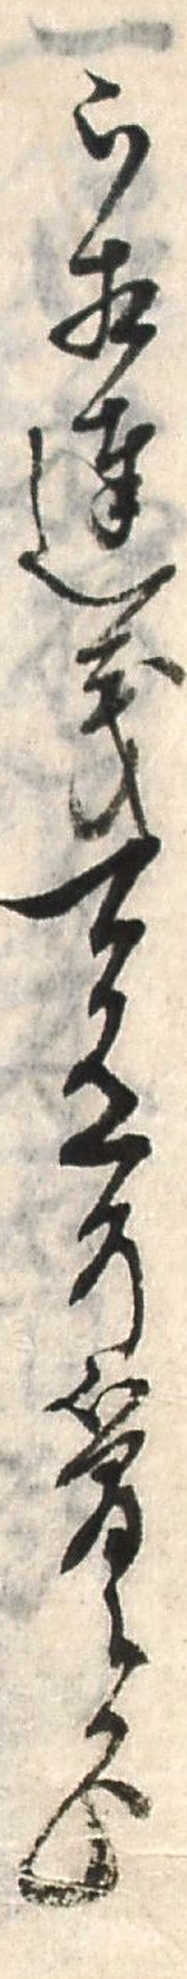被相達義可有了簡候以上
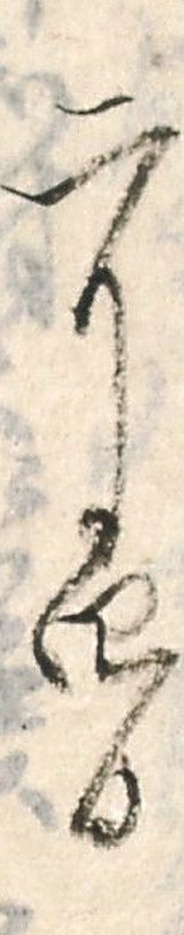二月四日
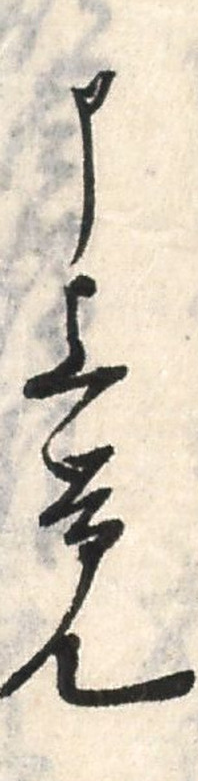申上覚
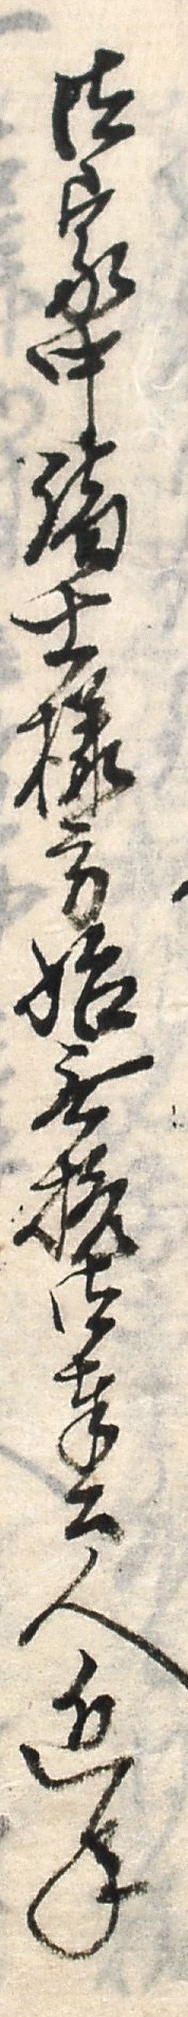御家中諸士様方始無格御奉公人近年
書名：御家中并無格御奉公人借銀御仕解一件御書付写其余共控
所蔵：鳴門教育大学 Naruto University of Education
